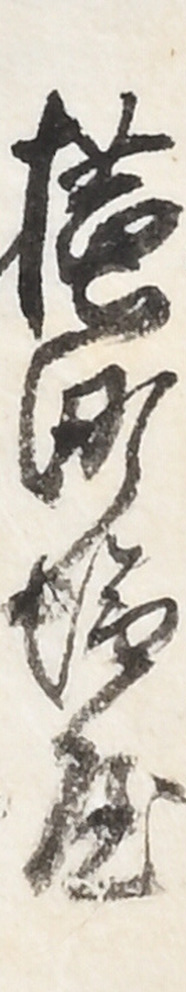横町塩屋
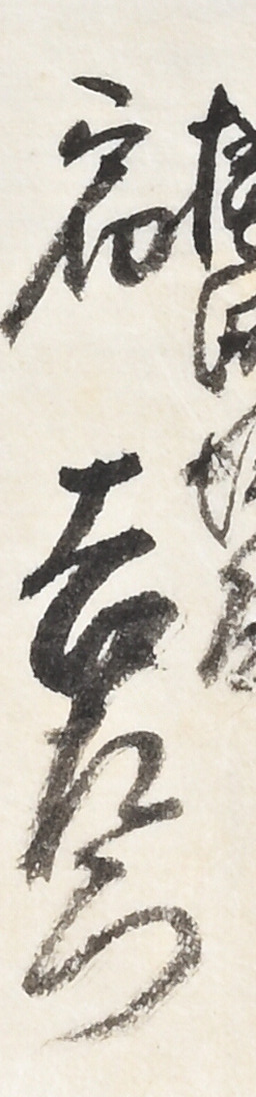宿吉左衛門
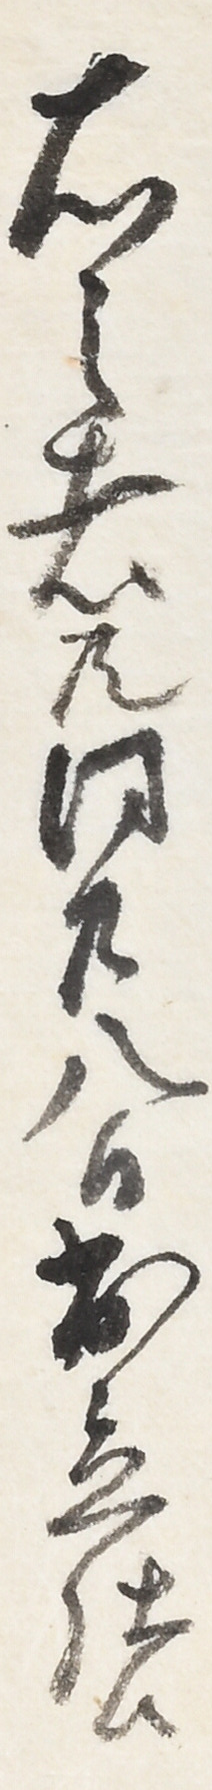右之者共同廿八日出立仕候
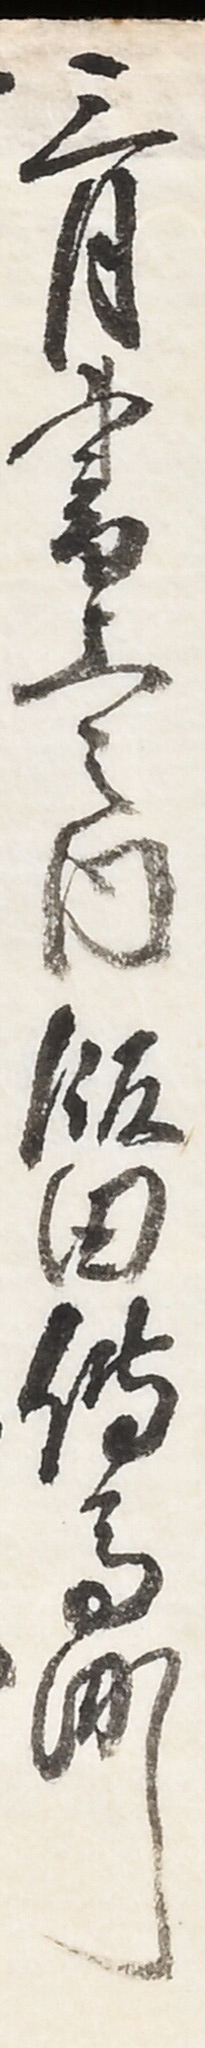三月書上之内飯田伝馬町
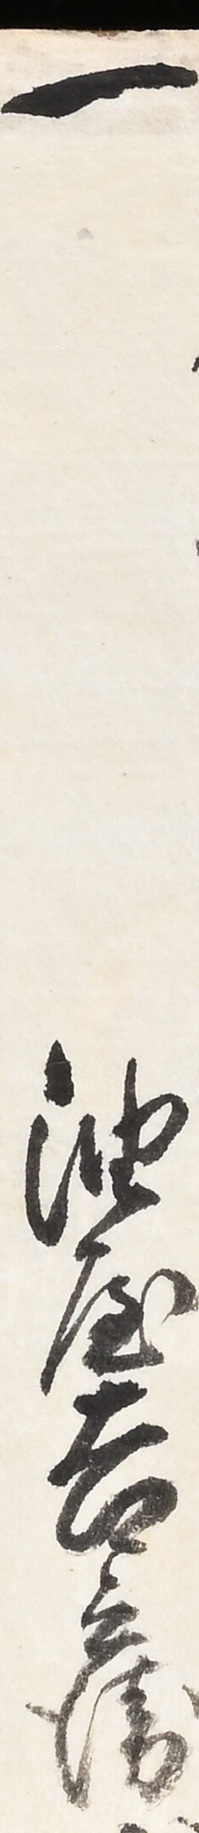一油屋吉兵衛〇
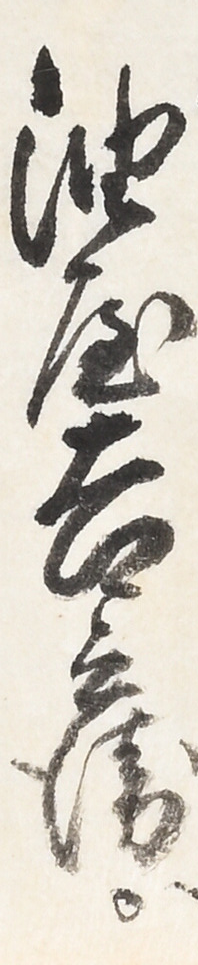一油屋吉兵衛〇
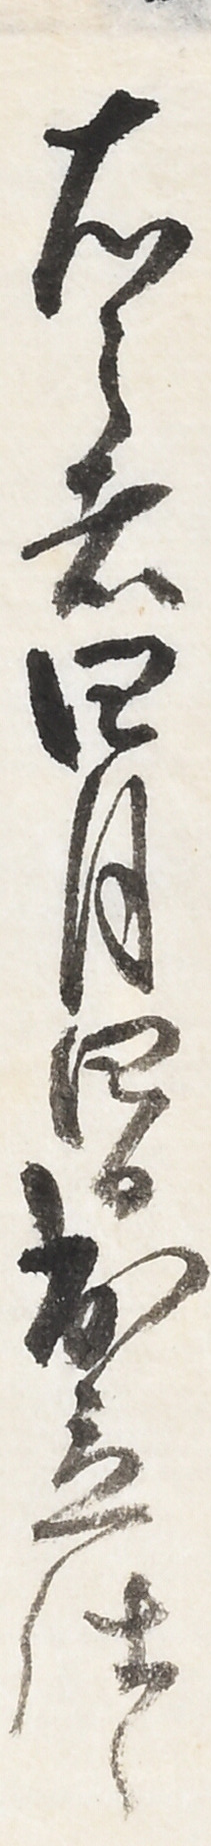右之者四月四日出立仕候
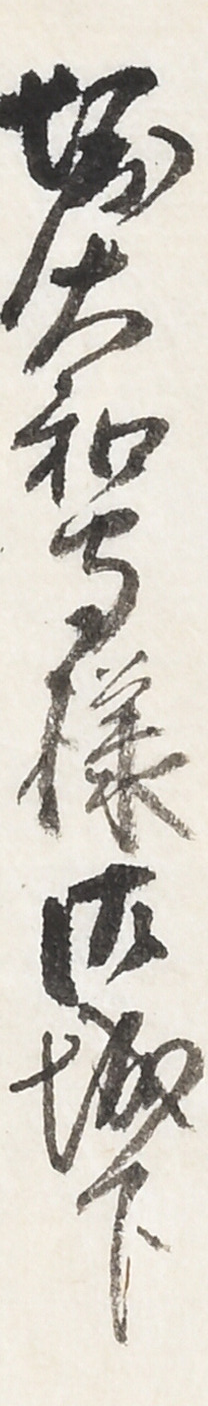堀大和守様御城下
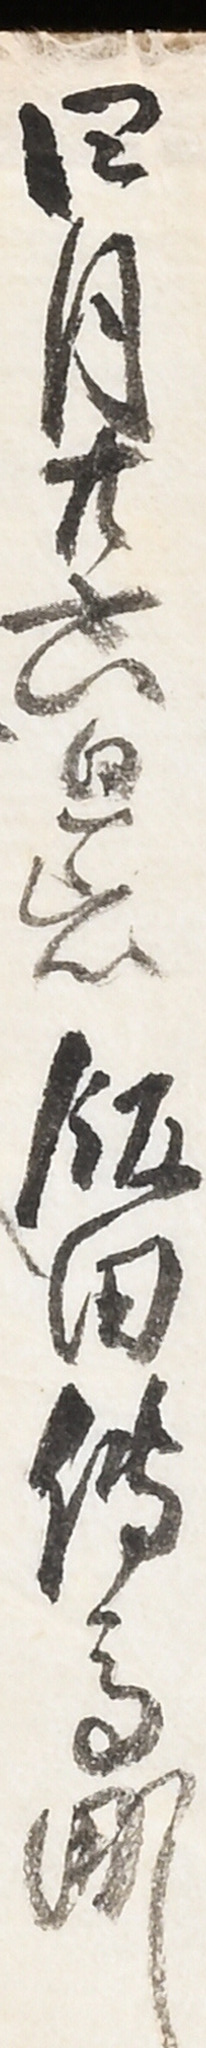四月廿六日着飯田伝馬町
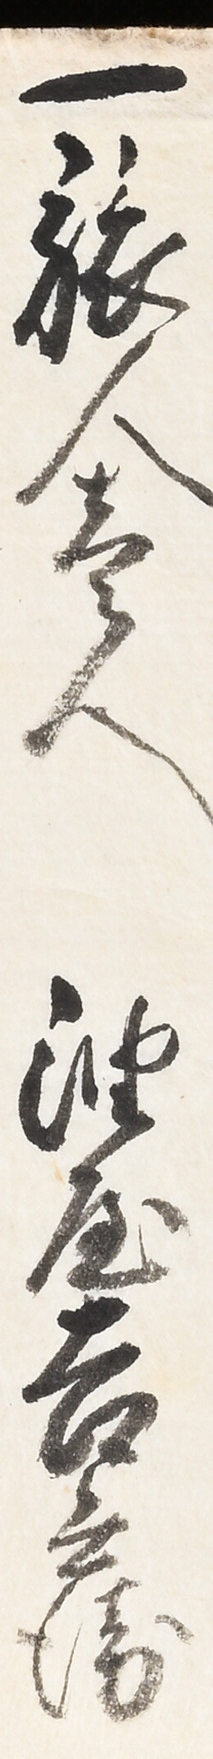一旅人壱人油屋吉兵衛
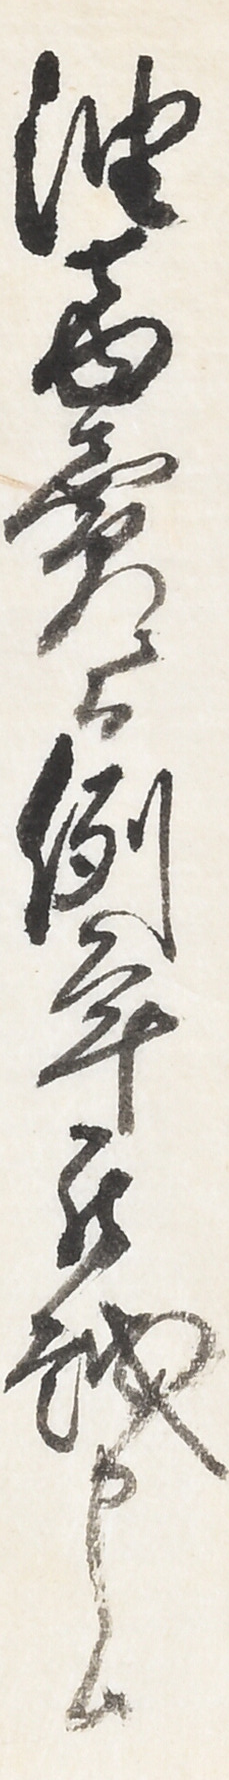油商売ニ而例年罷越申候
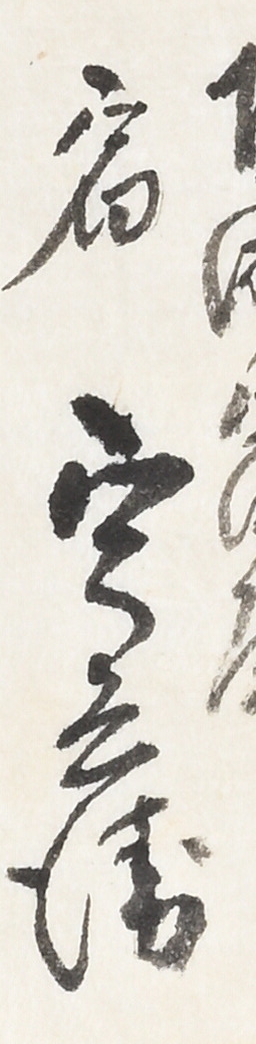宿宇兵衛
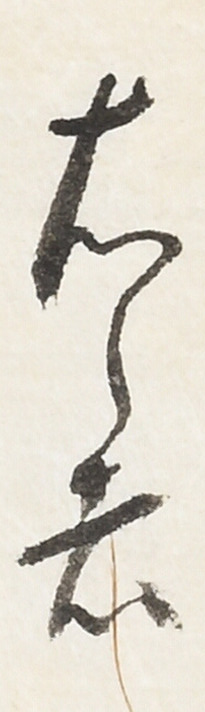右之者
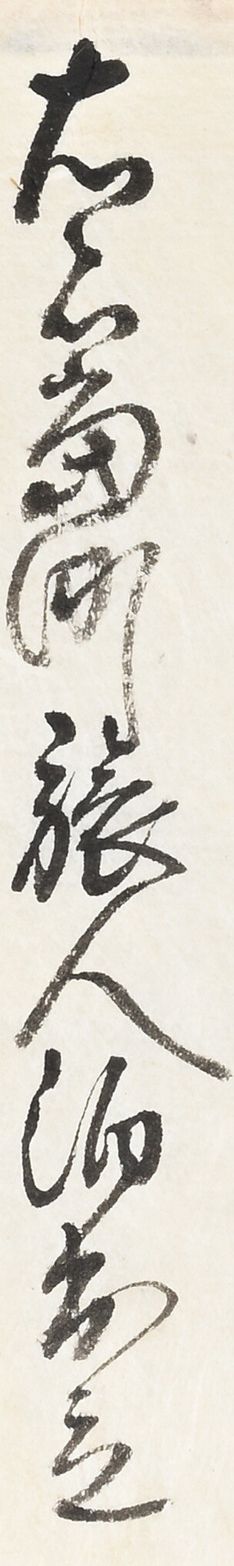右者当町旅人泊出立
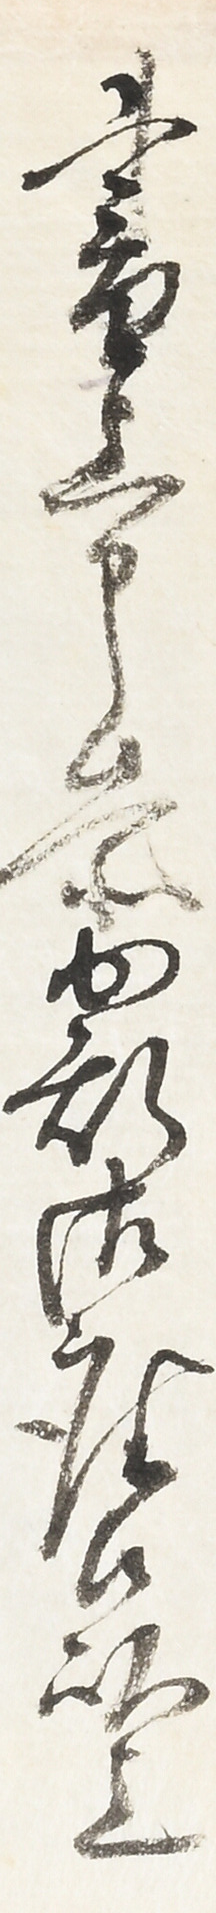書上申候所如斯御座候以上
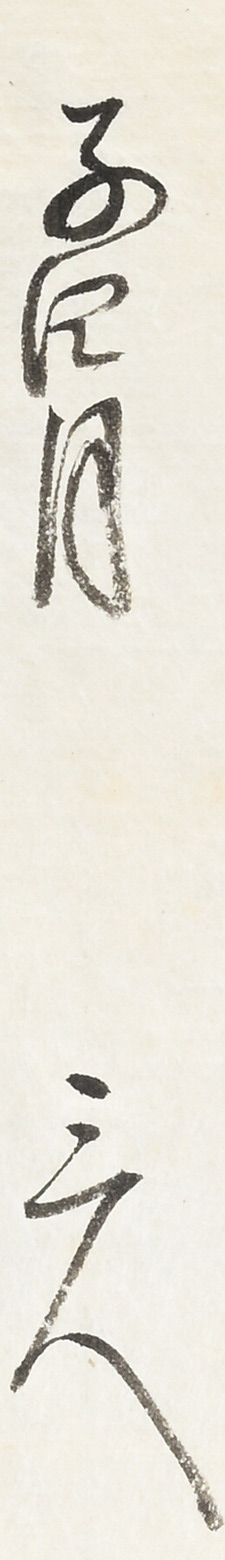子四月三人
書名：旅人泊控帳
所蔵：伊那市立高遠町図書館・合同会社AMANE
